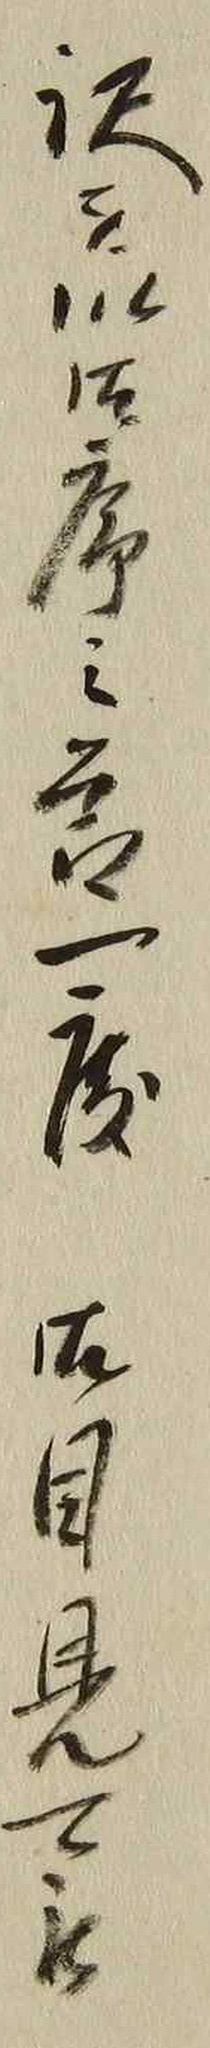訳を以御序之節一度御目見可被
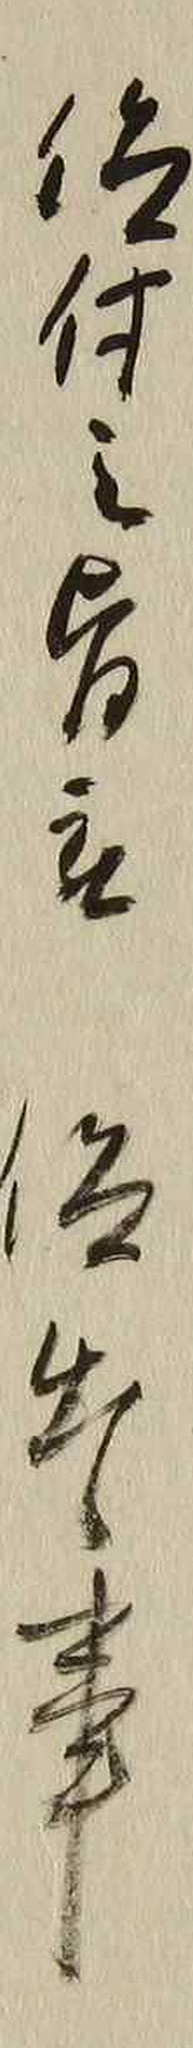仰付之旨被仰出候事
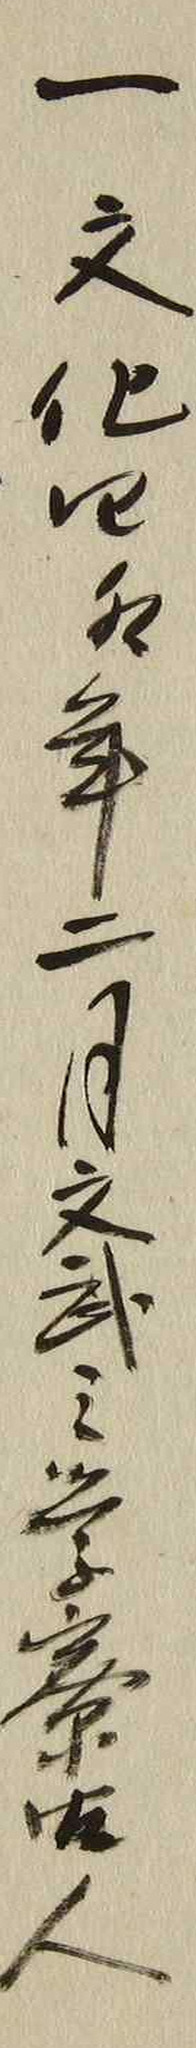一文化四卯年二月文武之学寮御人
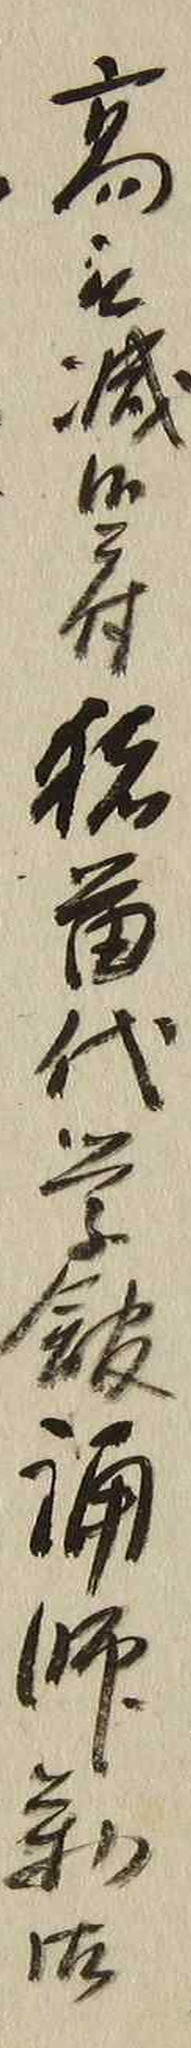高被減候に付猪苗代学館補師勤御
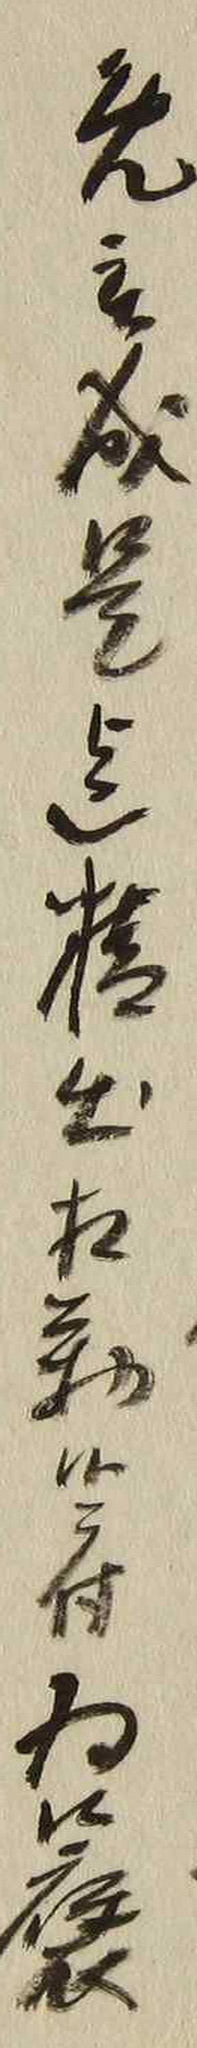免被成是迄精出相勤候に付為御褒
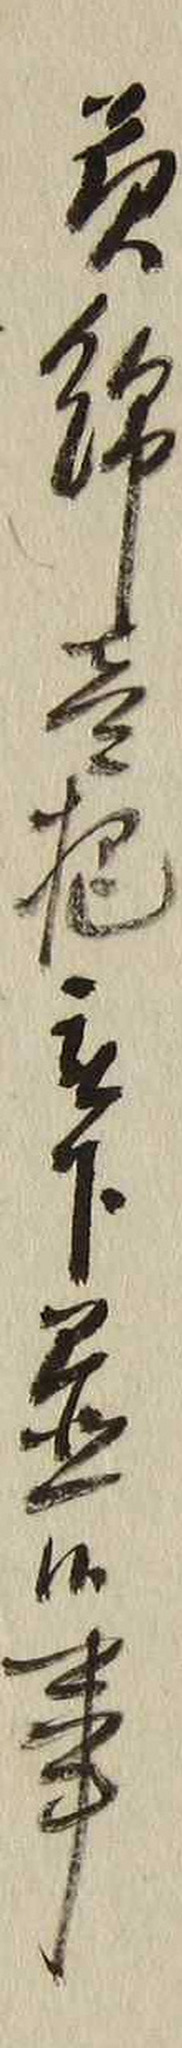美綿壱把被下置候事
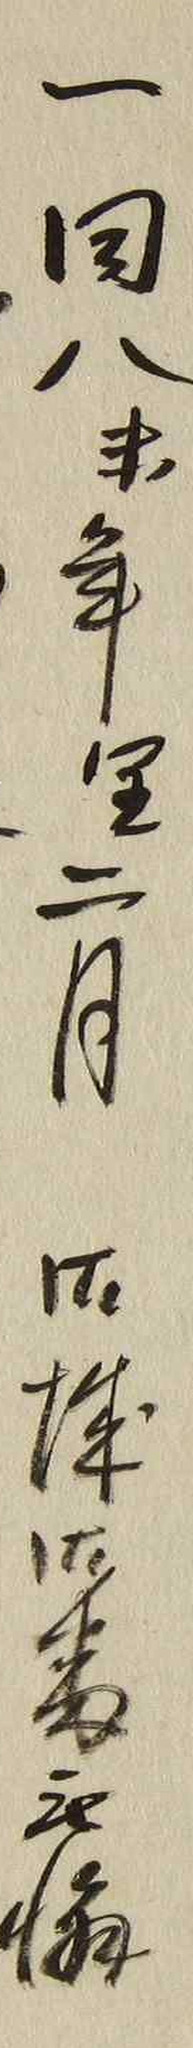一同八未年閏二月御城御番無懈
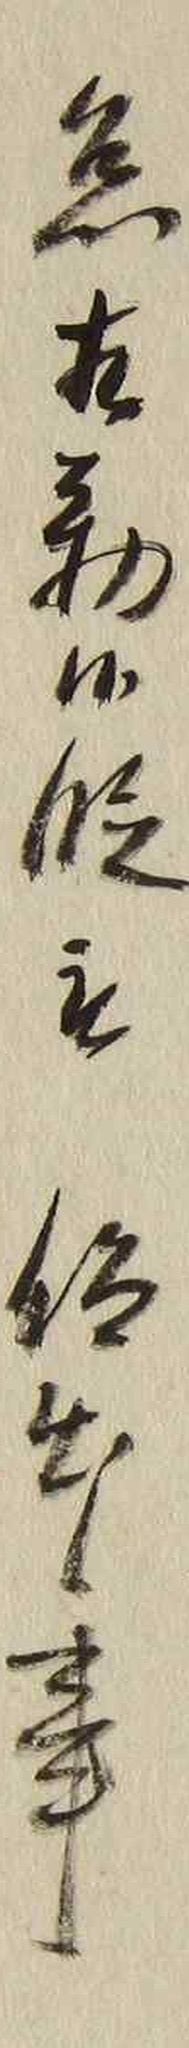怠相勤候段被仰出候事
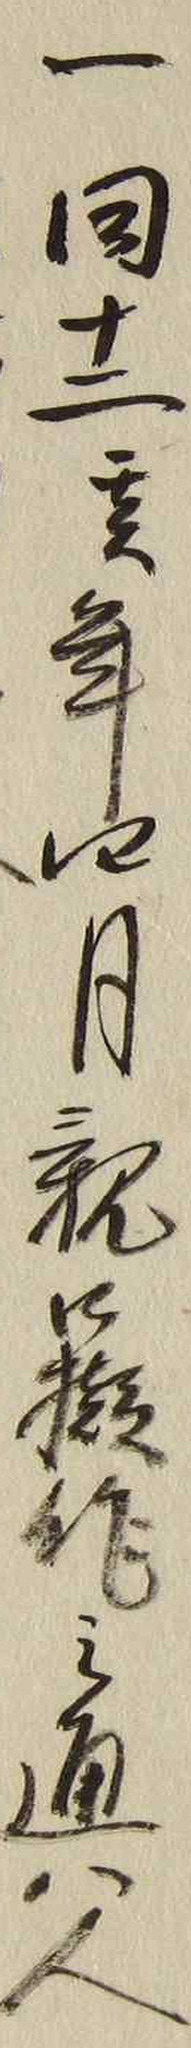一同十二亥年四月親御擬作之通八人
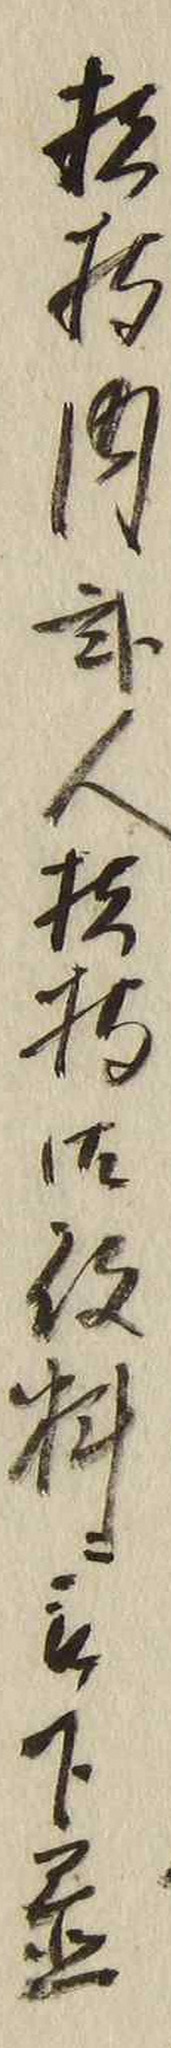扶持内弐人扶持御役料に被下置

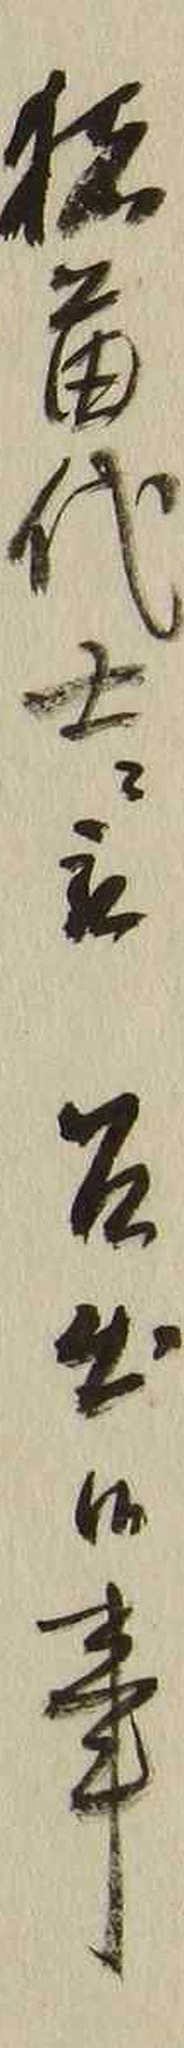猪苗代士に被召出候事
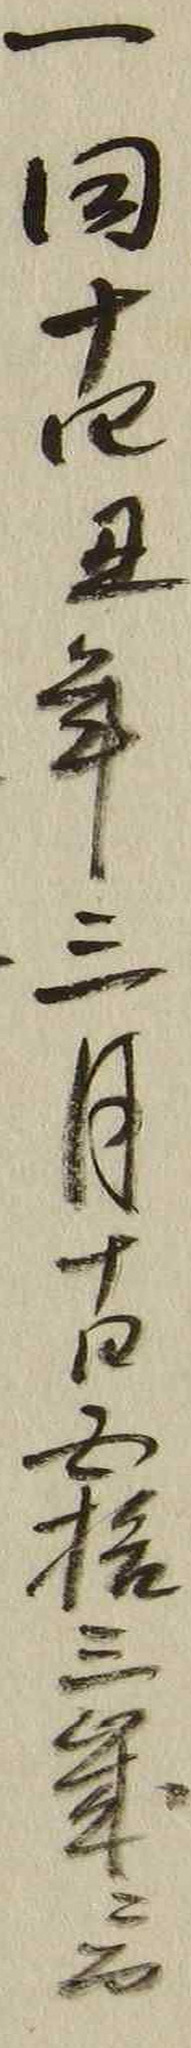一同十四丑年三月十四日五拾三歳に而
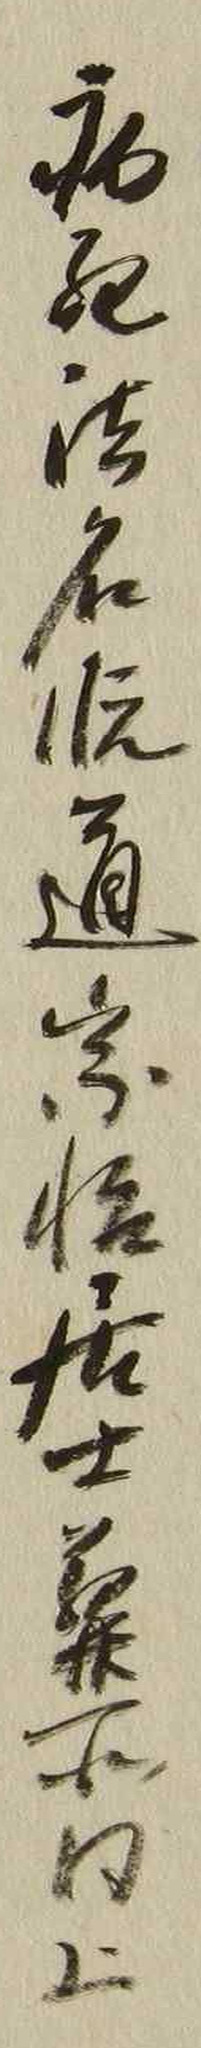病死法名悦通宗怡居士葬所同上
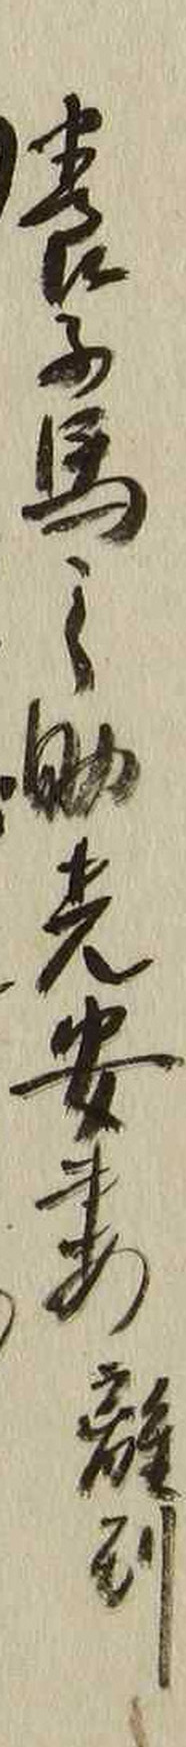女養子馬之助光安離別
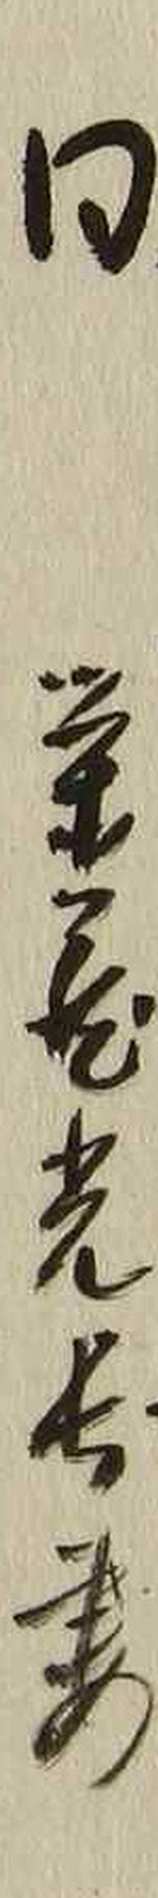栄蔵光長妻
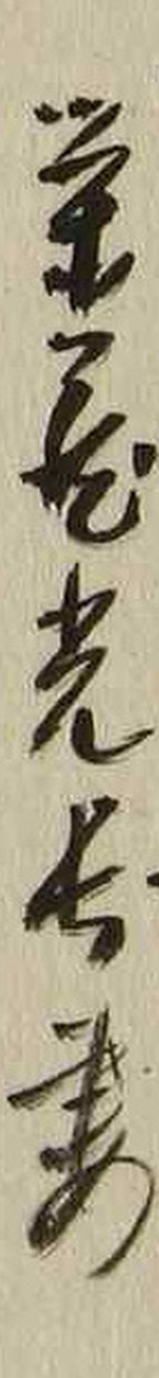栄蔵光長妻
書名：諸士系譜　巻之360　す之部10
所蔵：会津若松市立会津図書館
